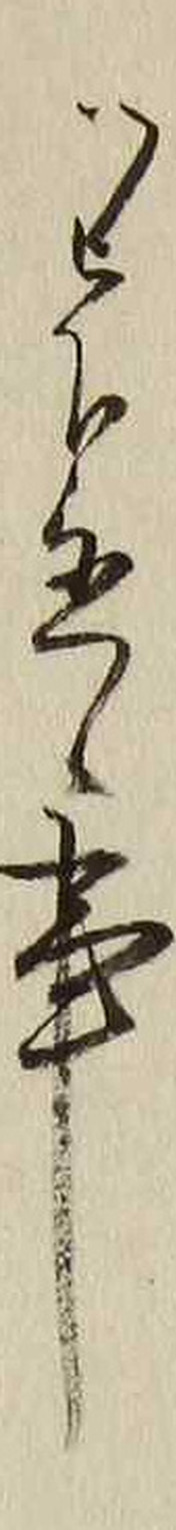被下置候事
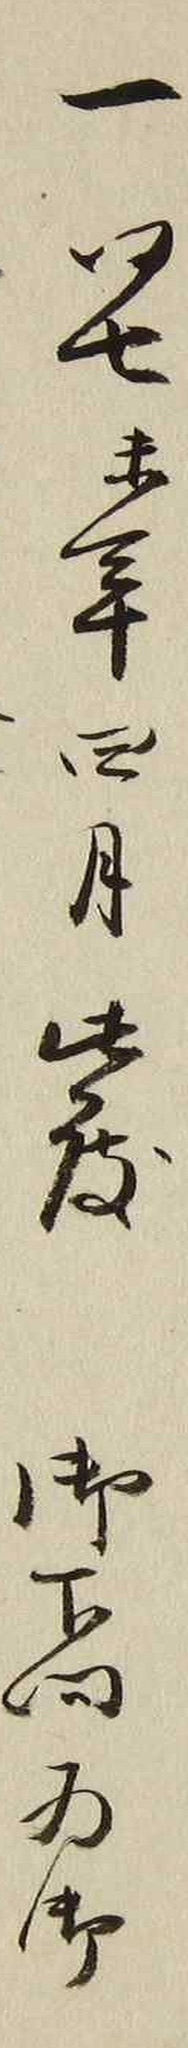一同七未年四月此度御下向為御
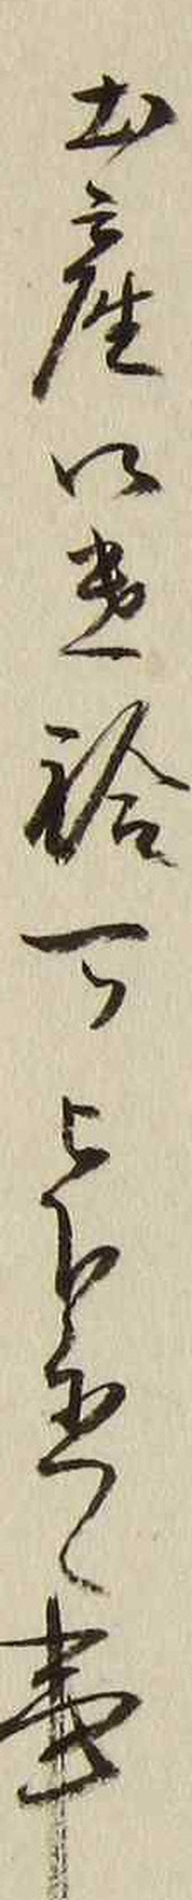土産御遣袷一つ被下置候事
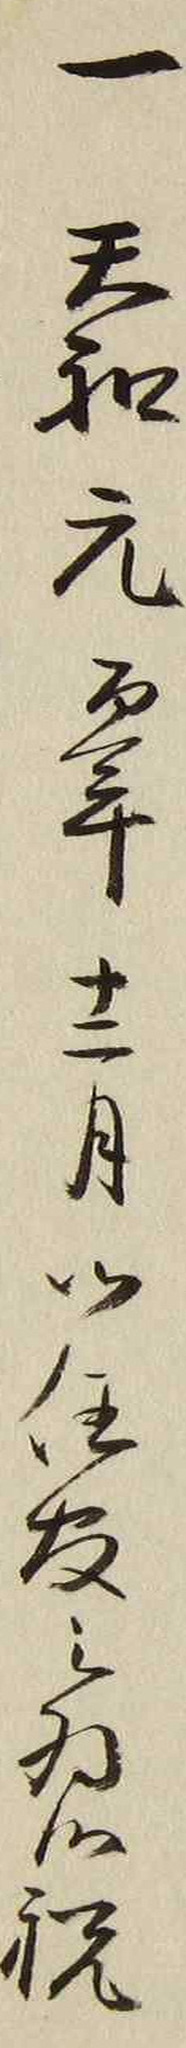一天和元酉年十二月御任官之為御祝
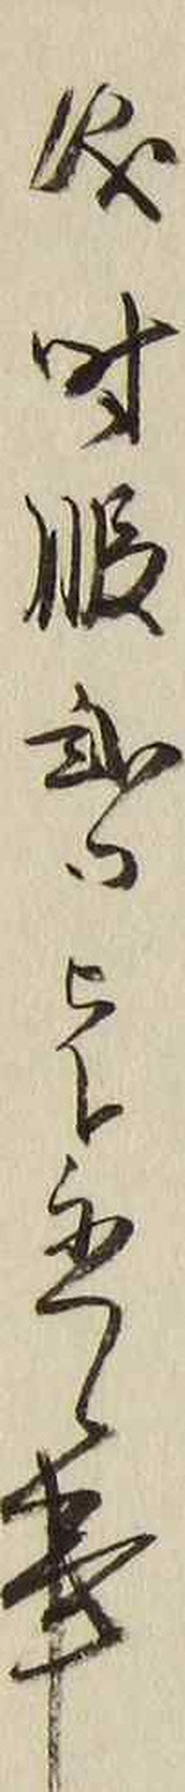儀時服弐つ被下置候事
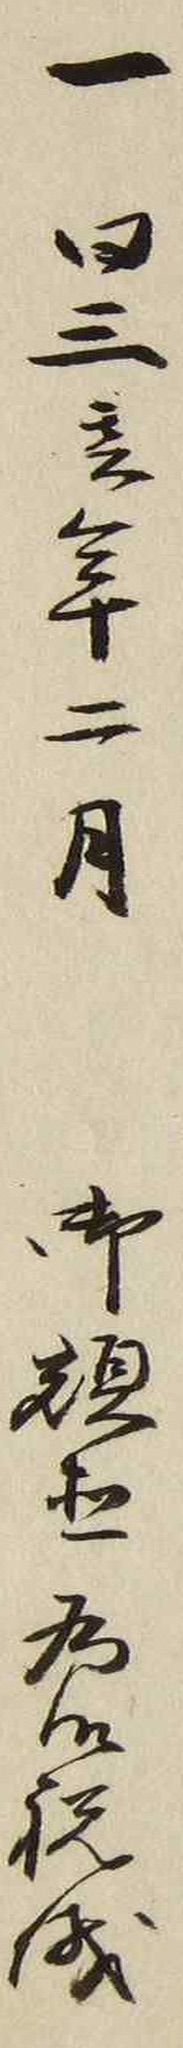一同三亥年二月御規直為御祝儀

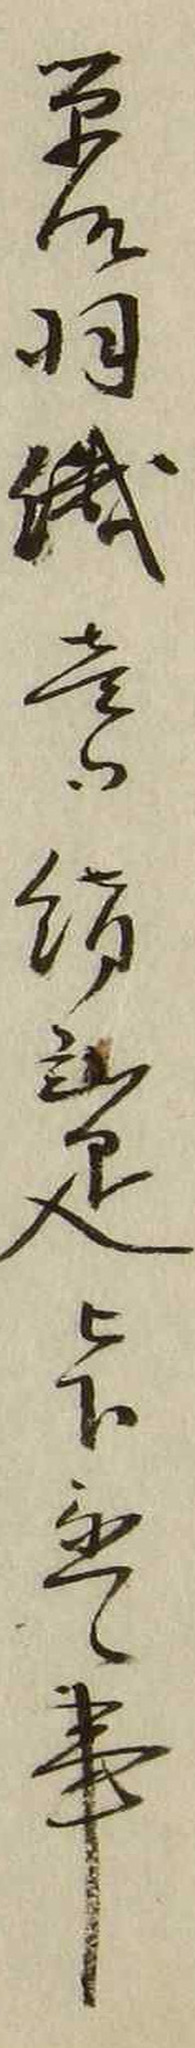単御羽織壱つ絹弐疋被下置候事
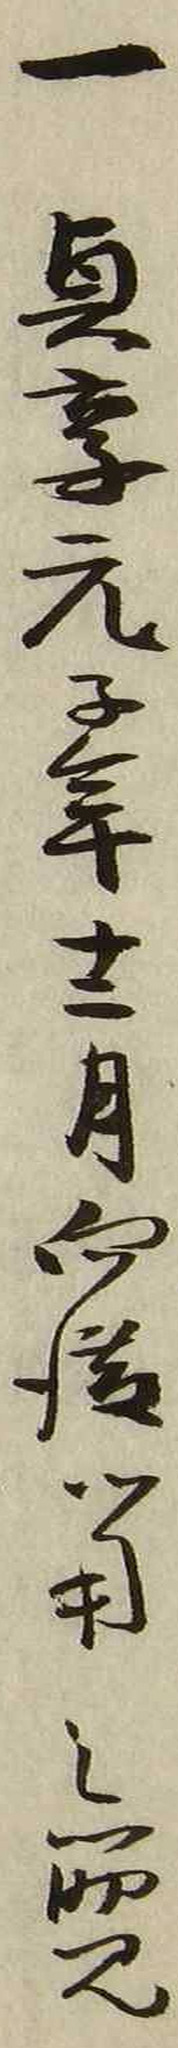一貞享元子年十月向後御用之節見
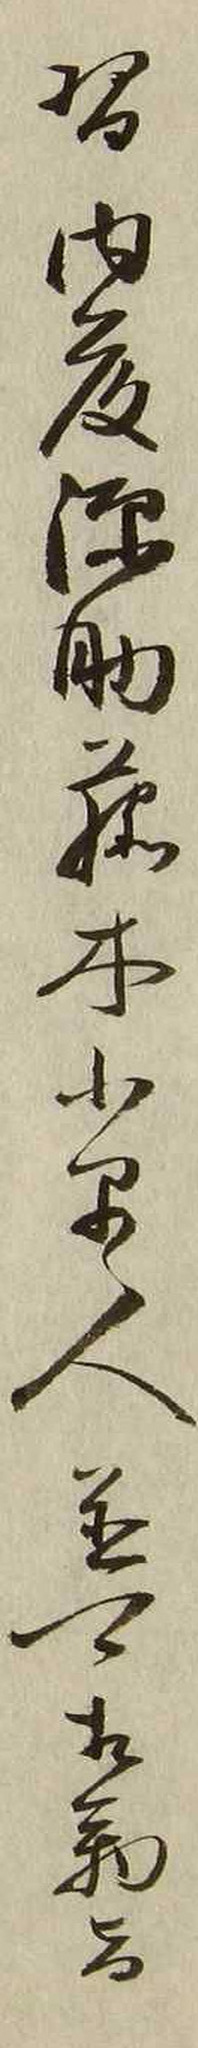習内藤源助藤木小平人並可相勤旨
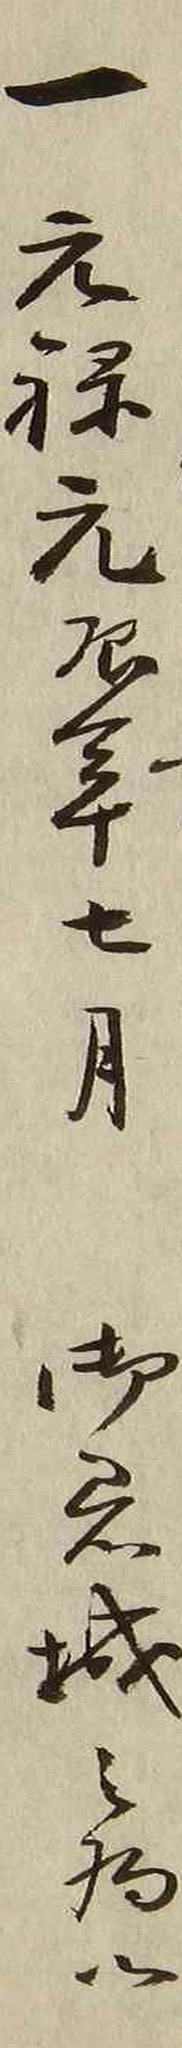一元禄元辰年七月御着城之為御
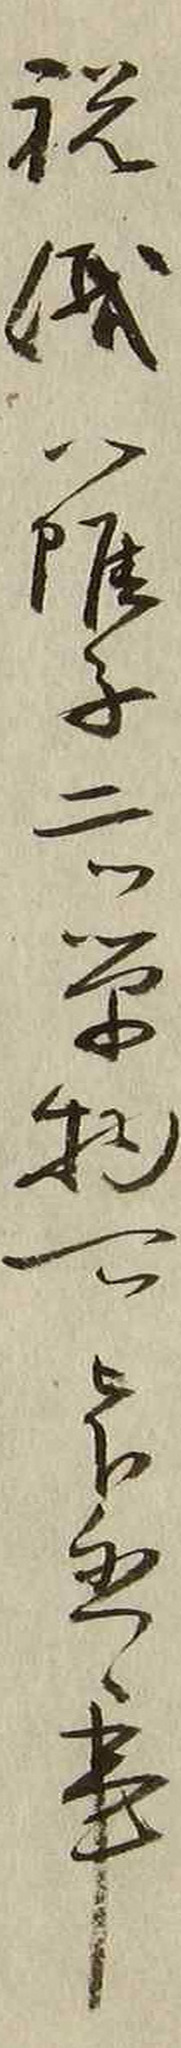祝儀御帷子二つ単物一つ被下置候事
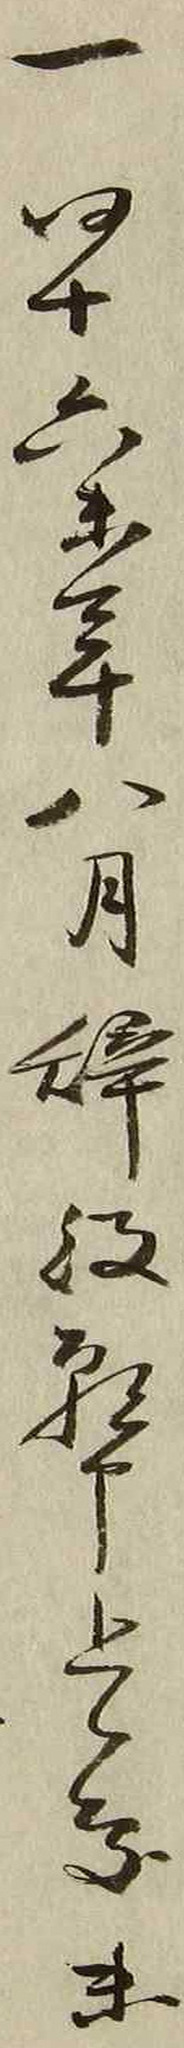一同十六未年八月辞役申上候処未
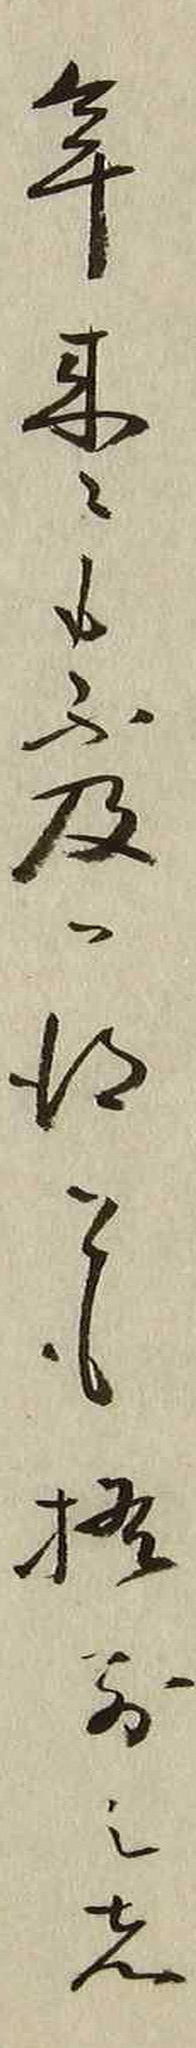年来にも不及候得とも格別之者
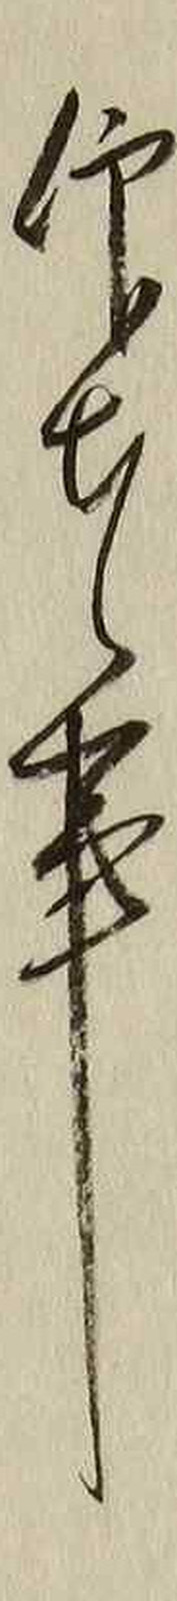仰出候事
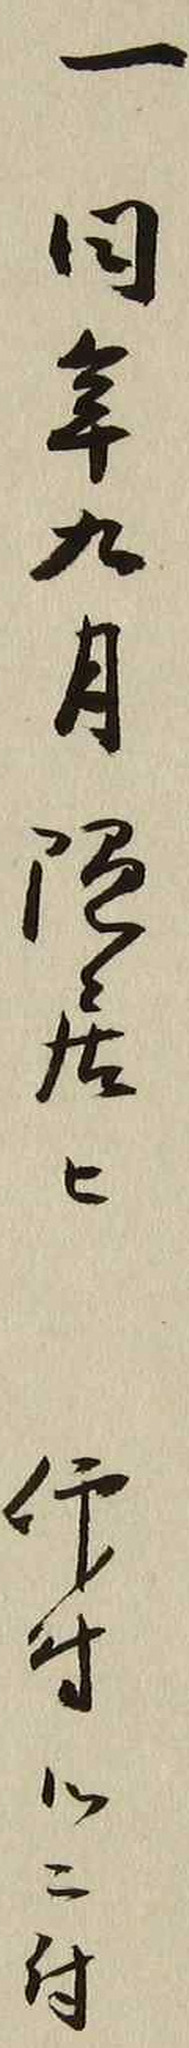一同年九月隠居被仰付候に付
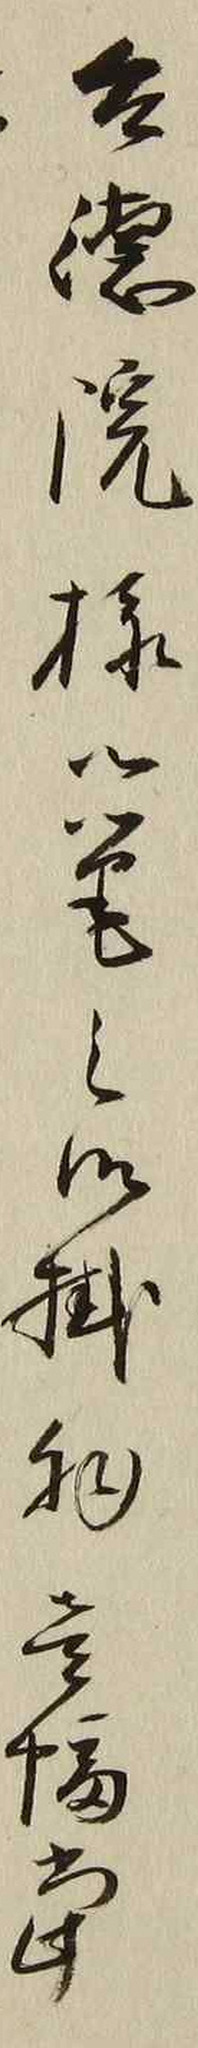吉徳院様御筆之御掛物壱輻当
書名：諸士系譜　巻之292　き之部1
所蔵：会津若松市立会津図書館
